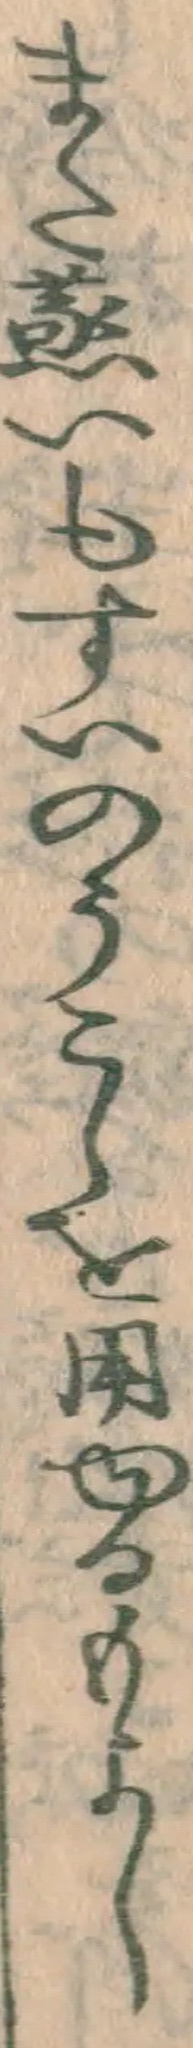また蒸いもすいのうこしを用ゆるもよし
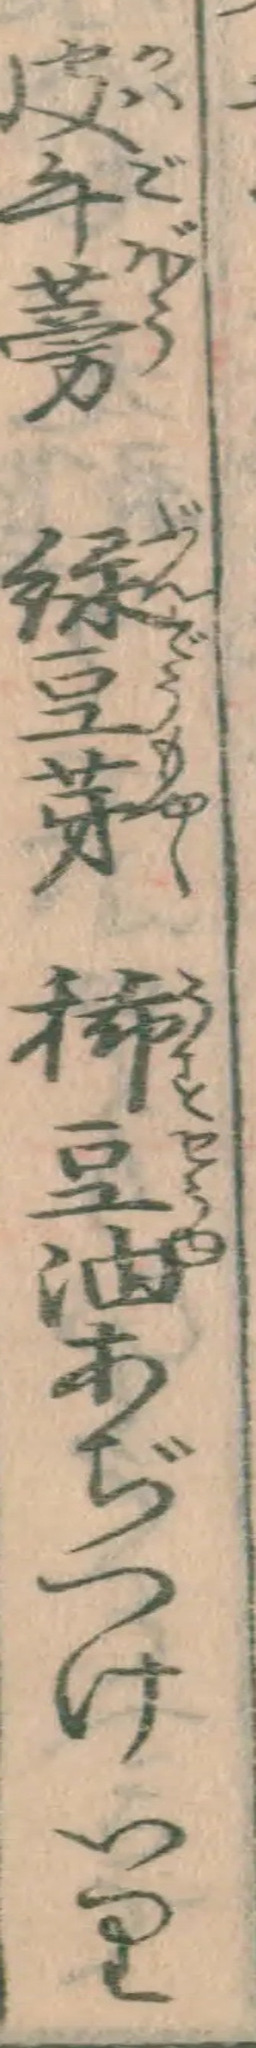皮午蒡緑豆芽稀豆油あぢつけいり
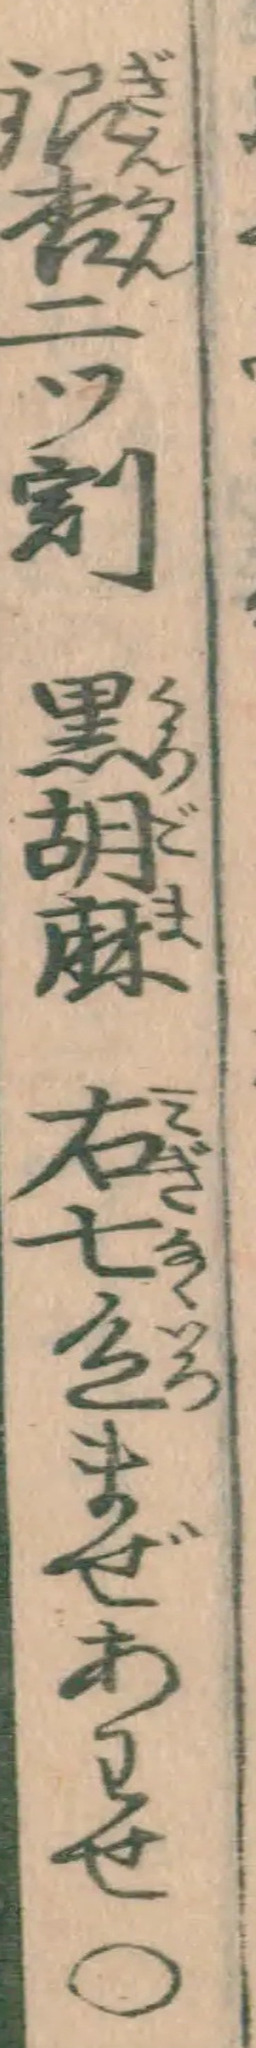銀杏二ツ割黒胡麻右七色まぜあわせ◯
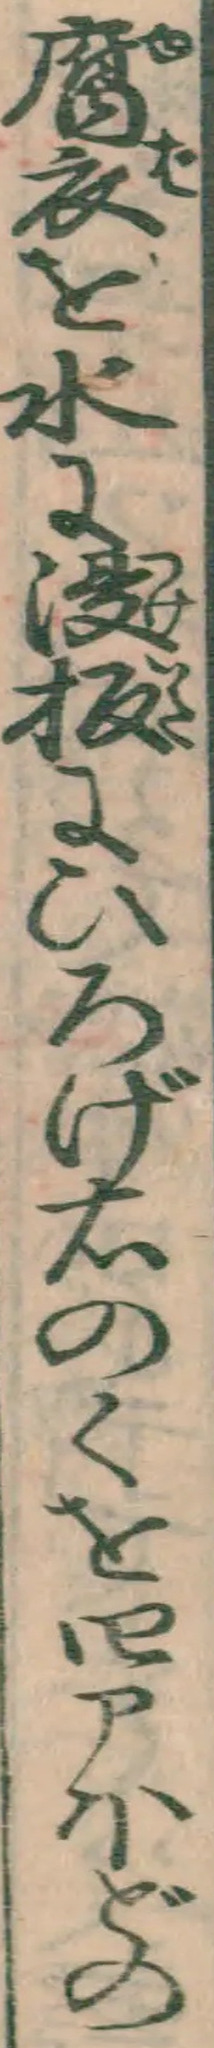腐衣を水に浸板にひろげ右のくを四分ほどの
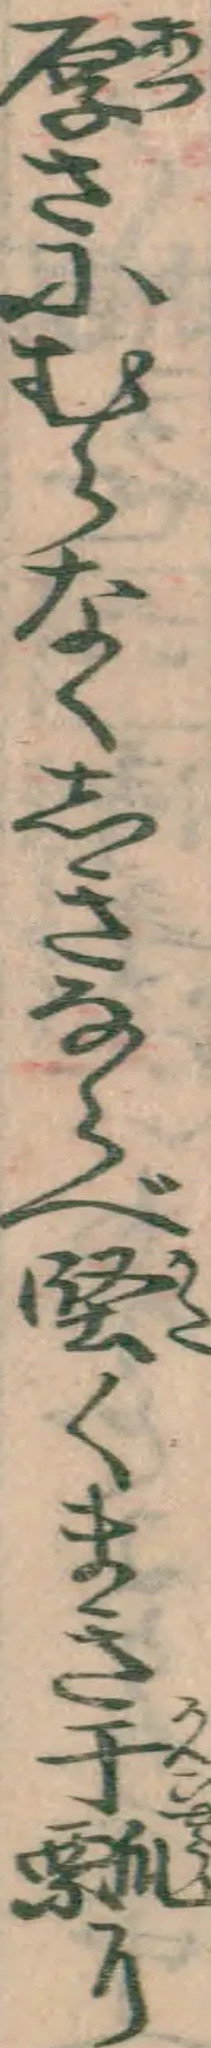厚さにむらなくしきならべ堅くまき干瓢に
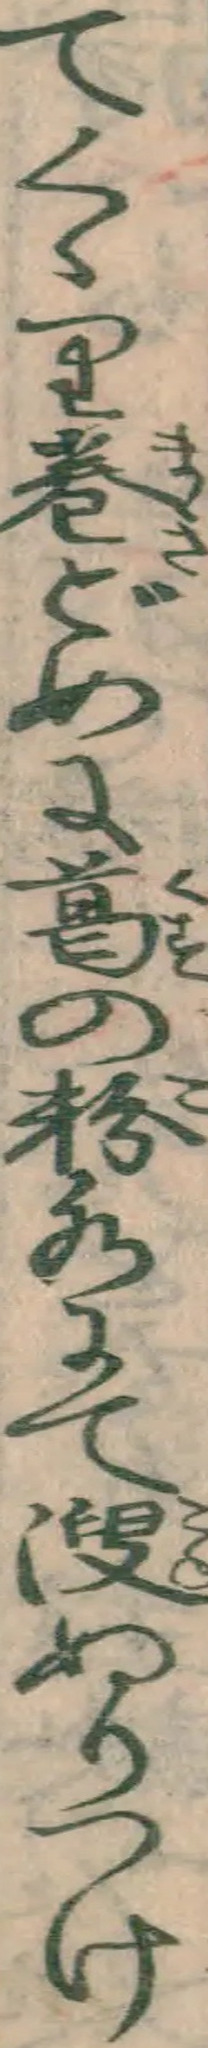てくゝり巻どめに葛の粉水にて溲ぬりつけ
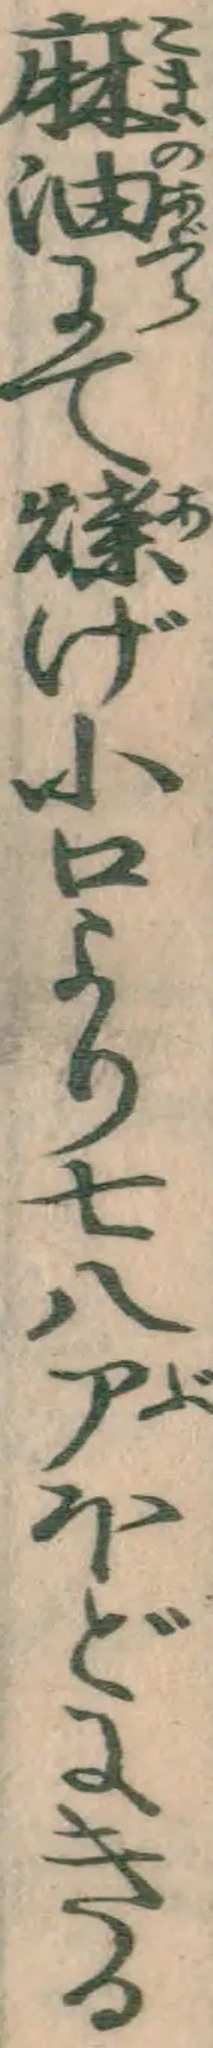麻油にて煠げ小口より七八分ほどにきる
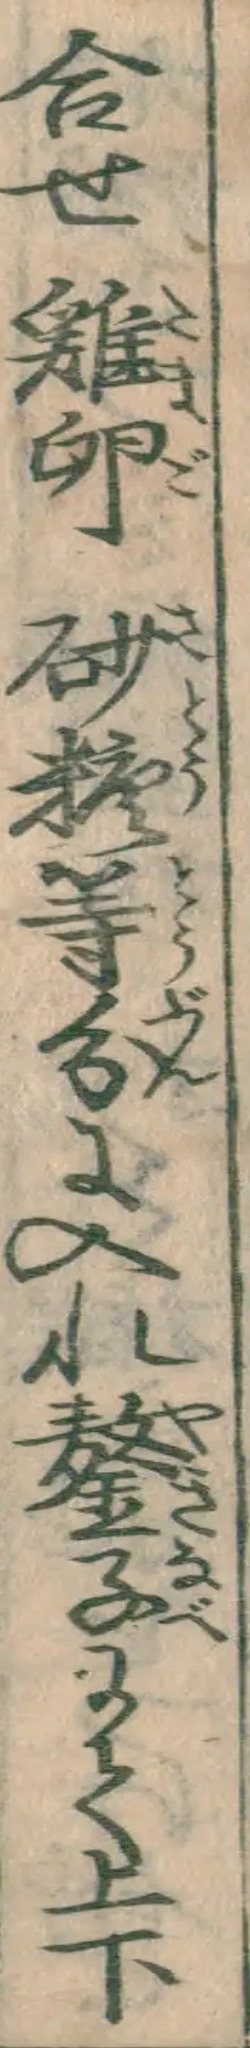合せ鶏卵砂糖等分に入れ鏊子にて上下
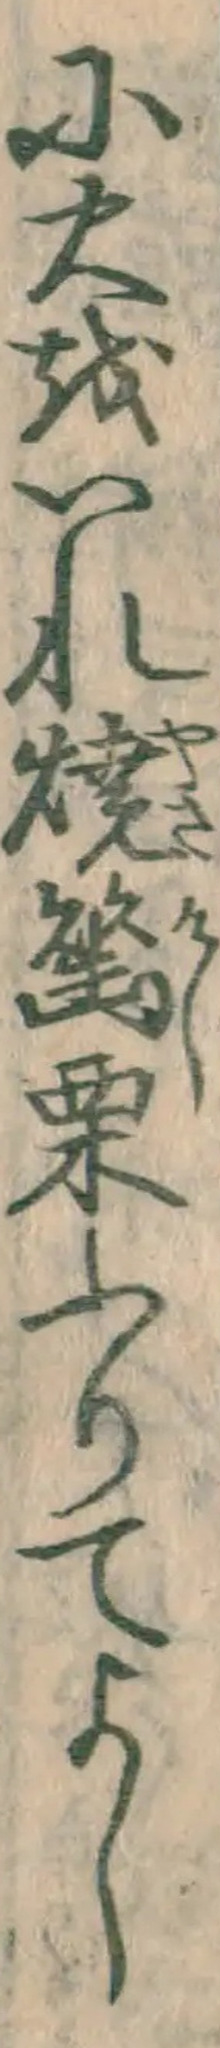に火をいれ焼罌栗ふりてよし

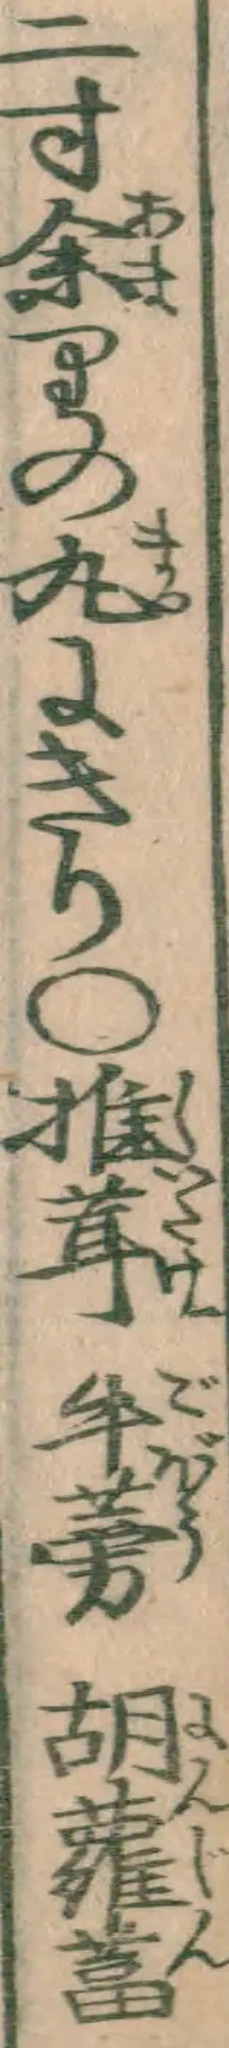二寸余りの丸にきり○椎茸牛蒡胡蘿葍
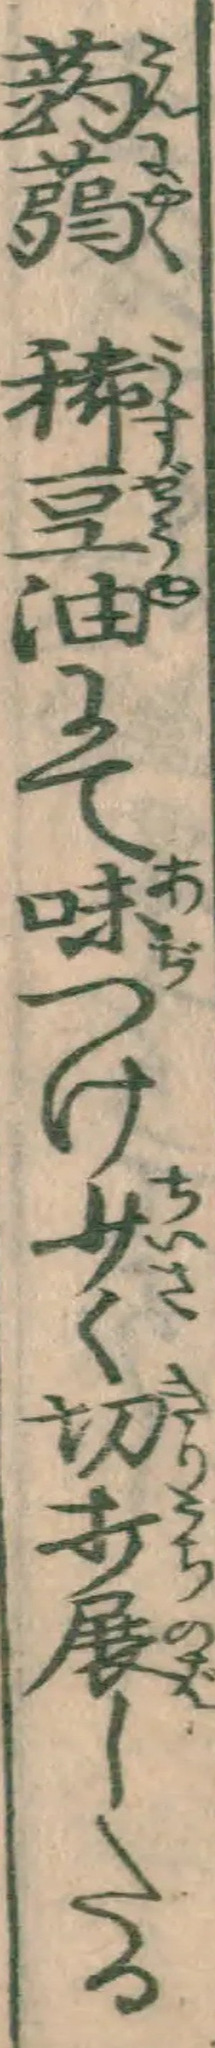蒟蒻稀豆油にて味つけ少く切打展したる
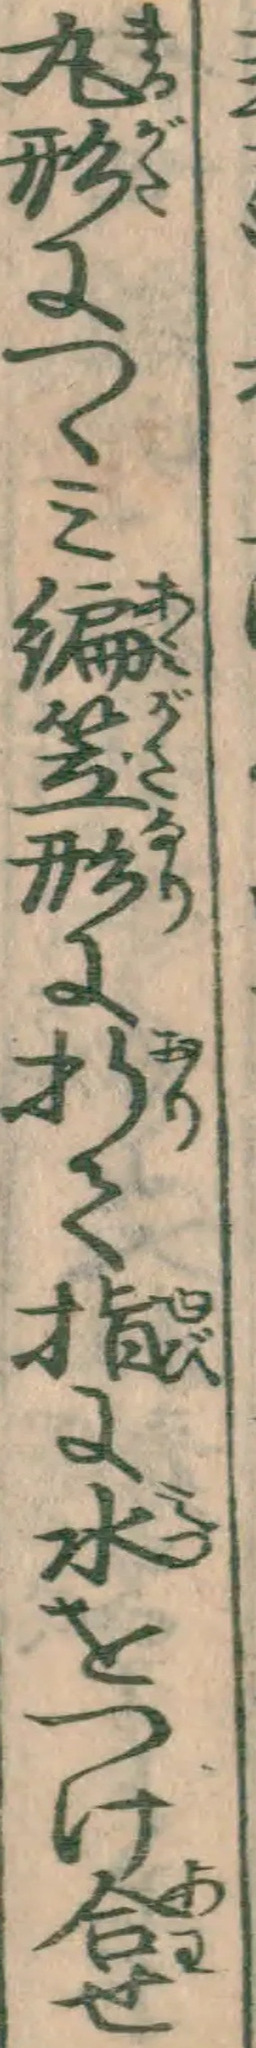丸形につゝみ編笠形に折て指に水をつけ合せ
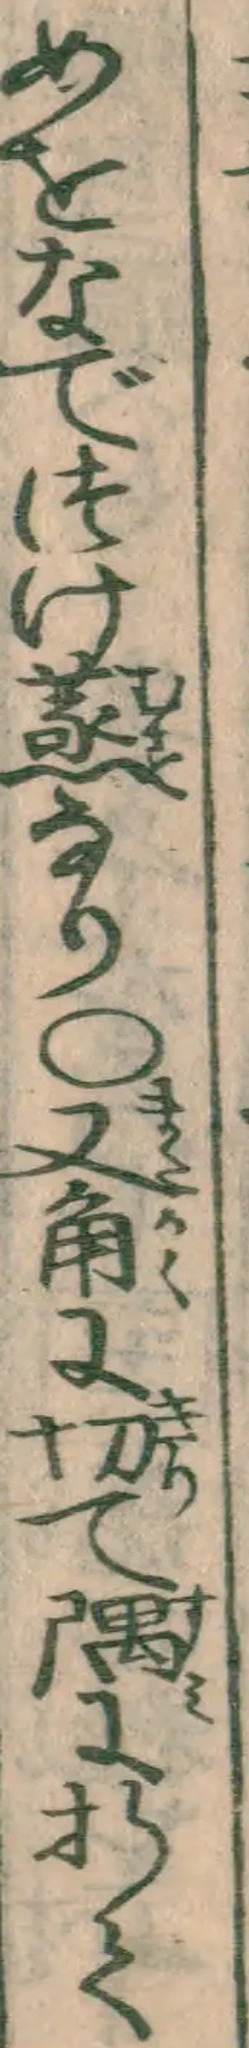めをなでつけ蒸なり◯又角に切て隅に折て
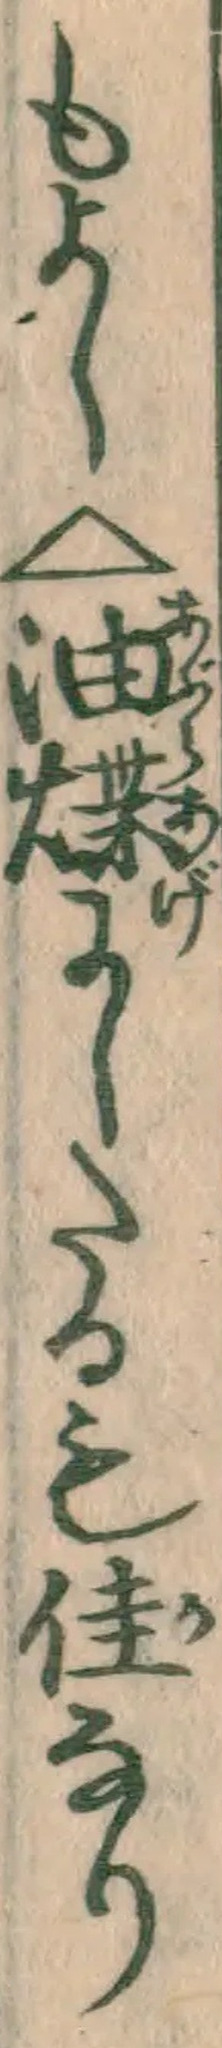もよし△油煠にしたるも佳なり
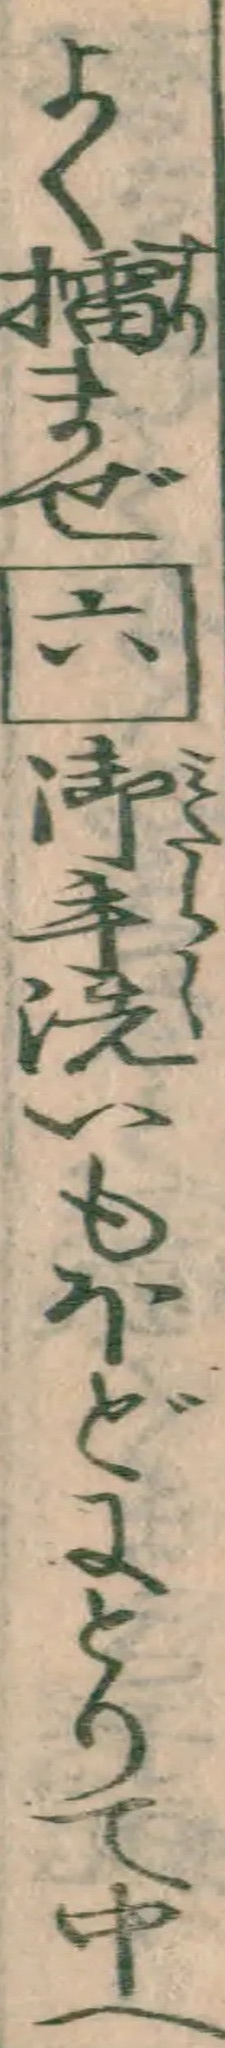よく擂まぜ[六]御手洗いもほどにとりて中へ
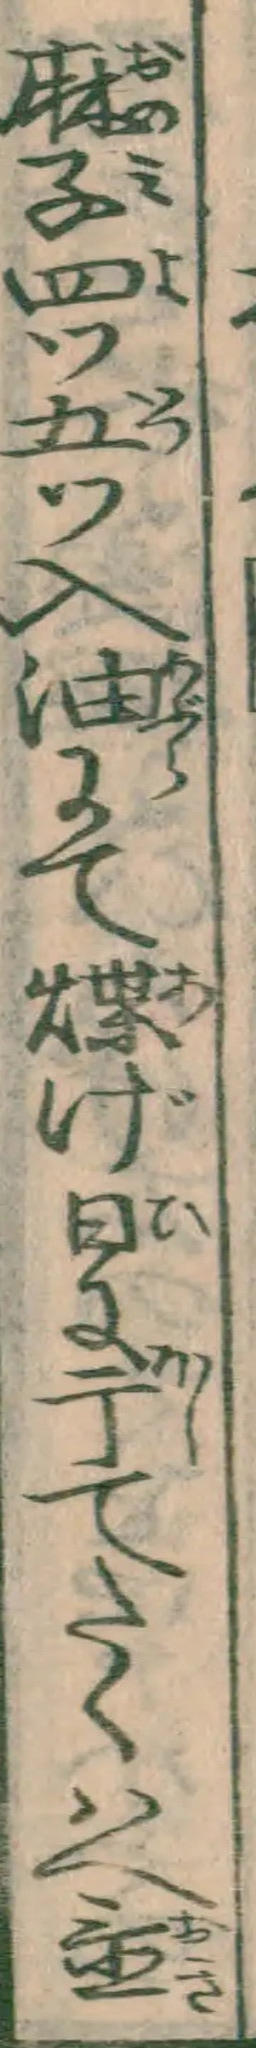麻子四ツ五ツ入油にて煠げ日に干てたくはへ置
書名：甘藷百珍
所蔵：国立国会図書館 National Diet Library, JAPAN
